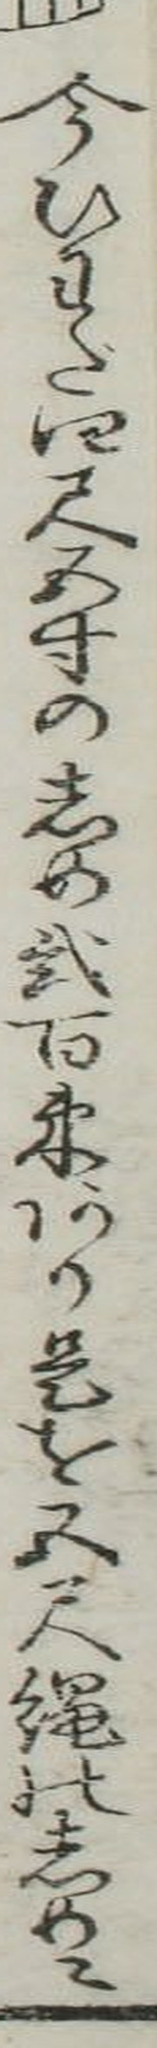今ひわだ四尺五寸のしめ弐百束あり是を五尺縄のしめに
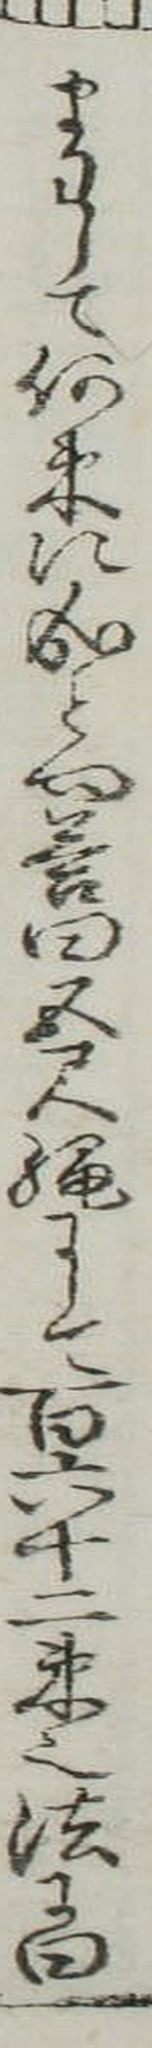まわして何束に成と問答曰五尺縄にして百六十二束也法に曰
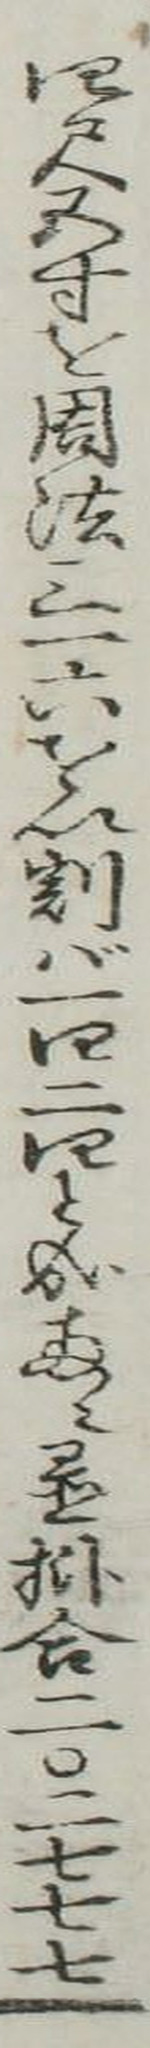四尺五寸を周法三一六を以割ば一四二四と成両に置掛合二〇二七七七
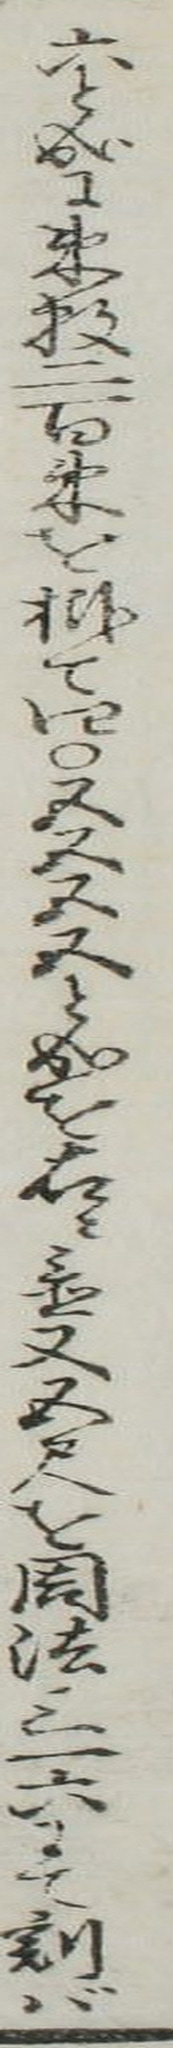六と成に束数二百束を掛て四〇五五五五と成を右に置又五尺を周法三一六にて割ば
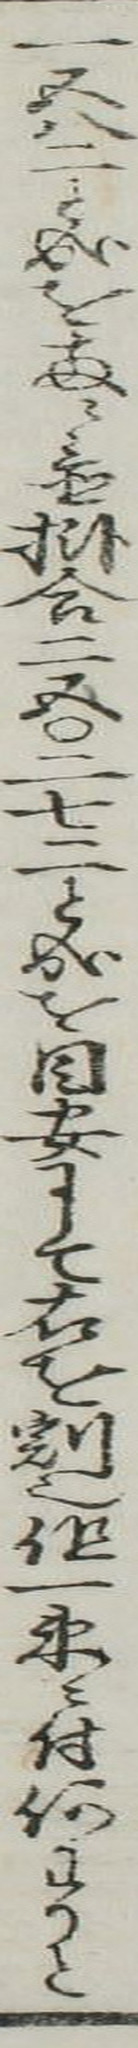一五八二と成を両に置掛合二五〇二七二と成を目安にして右を割也但一束に付何わりと
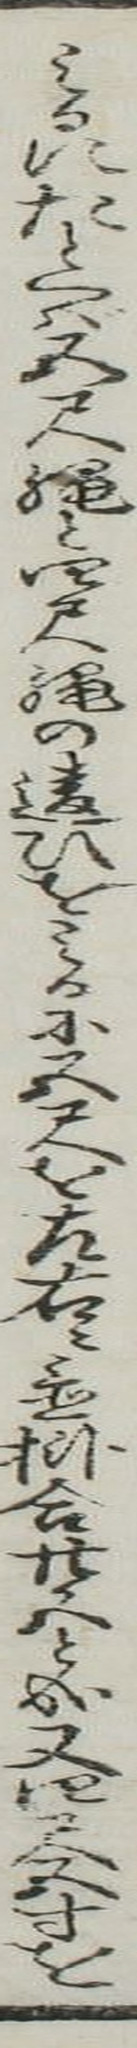みるにたとへば五尺縄と四尺縄の違ひをみるに五尺を左右に置掛合廿五と成又四尺五寸を
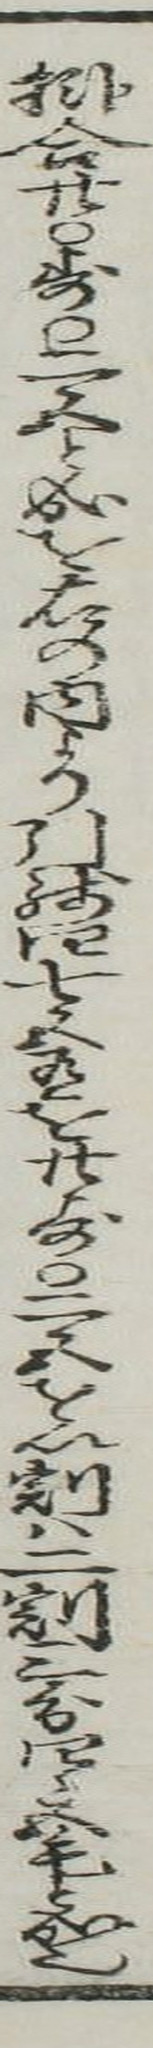掛合廿〇歩〇二五と成を右の内より引残四七五有を廿歩〇二五を以割は二割三分四厘五毛と成也
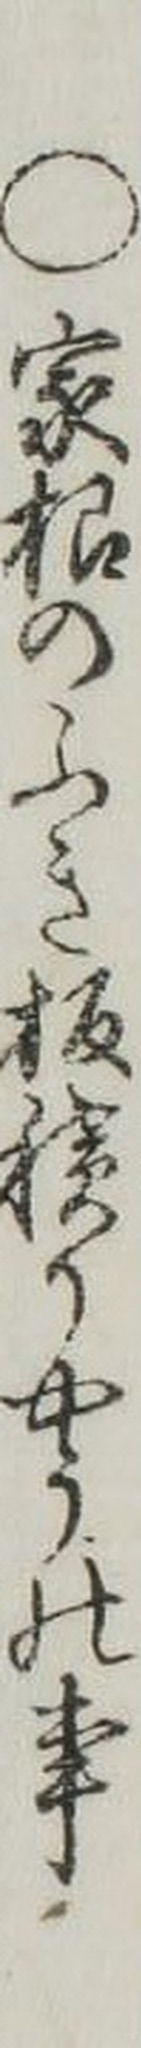○家根のふき板積りやうの事
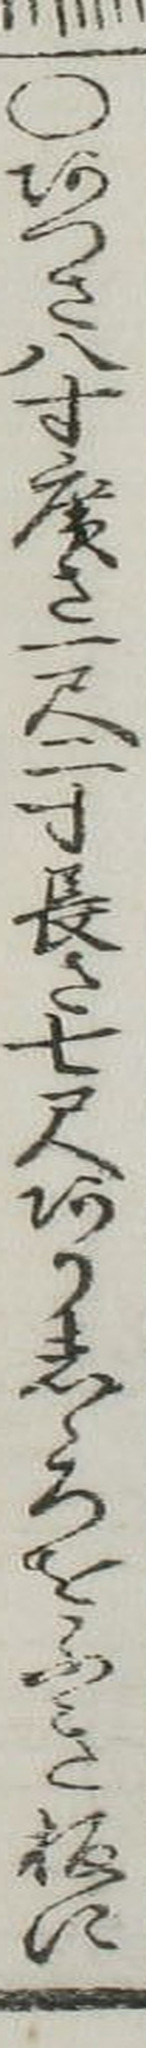○あつさ八寸広さ一尺二寸長さ七尺ありしゝろをふき板に
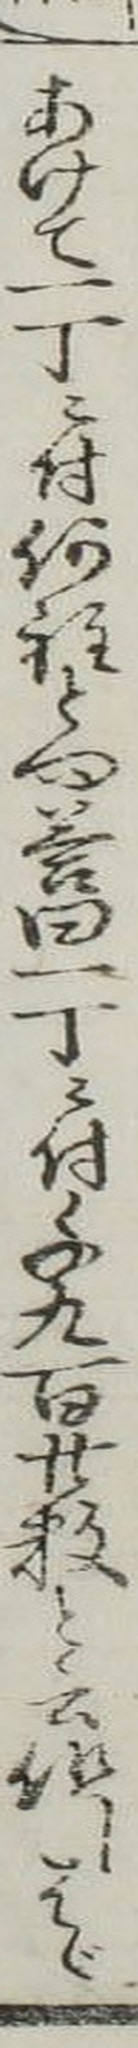あけて一丁に付何程と問答曰一丁に付千九百廿数と云但しはゞ
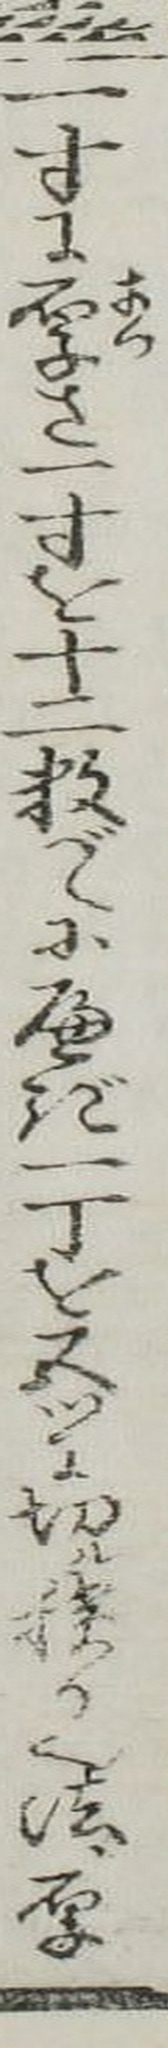一寸に厚さ一寸を十二数づゝにへぎ一丁を五ツに切る積り也法に厚
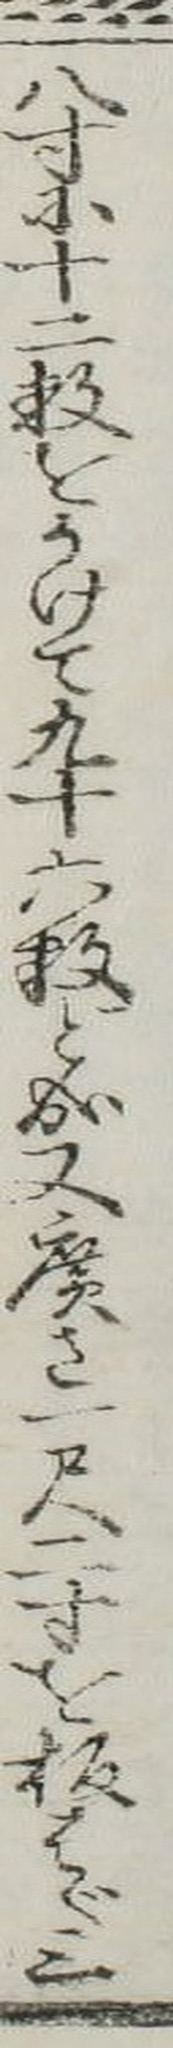八寸に十二数をかけて九十六数と成又広さ一尺二寸を板はゞ三
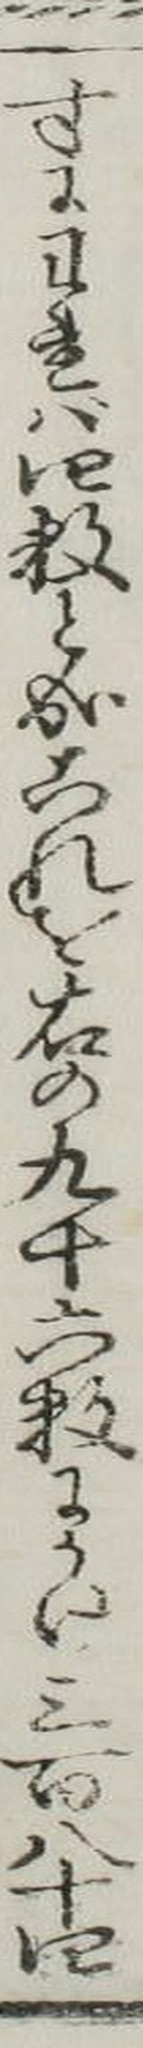寸にわれば四数と成これを右の九十六数にかけ三百八十四
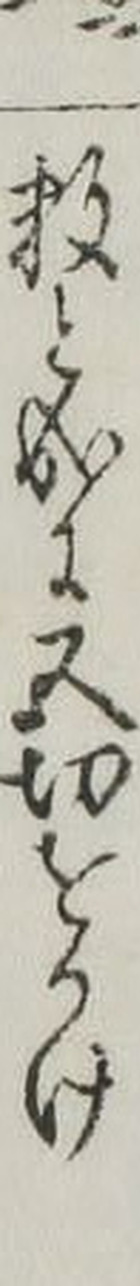数と成に五切をかけ
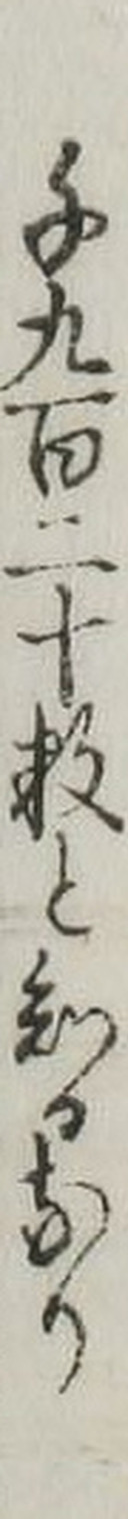千九百二十数と知るなり
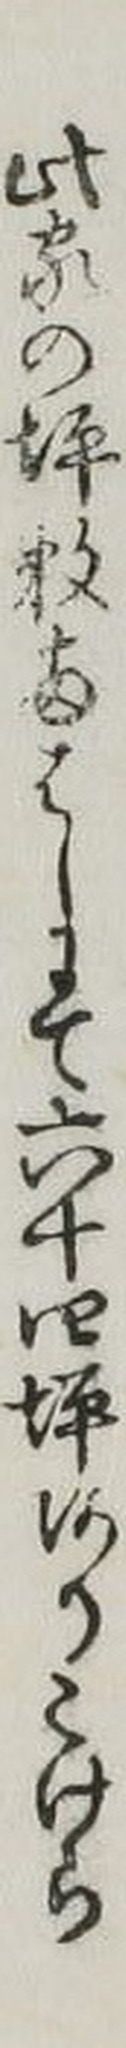此家の坪数両はしにて六十四坪ありこけら
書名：宝玉塵劫記
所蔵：東京学芸大学教育コンテンツアーカイブ
